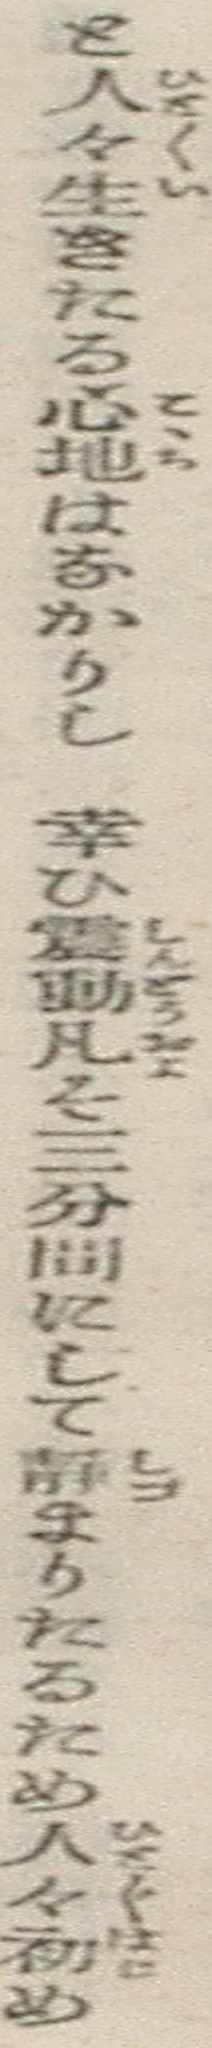と人々生きたる心地はなかりし幸ひ震動凡そ三分にして静まりたるため人々初め
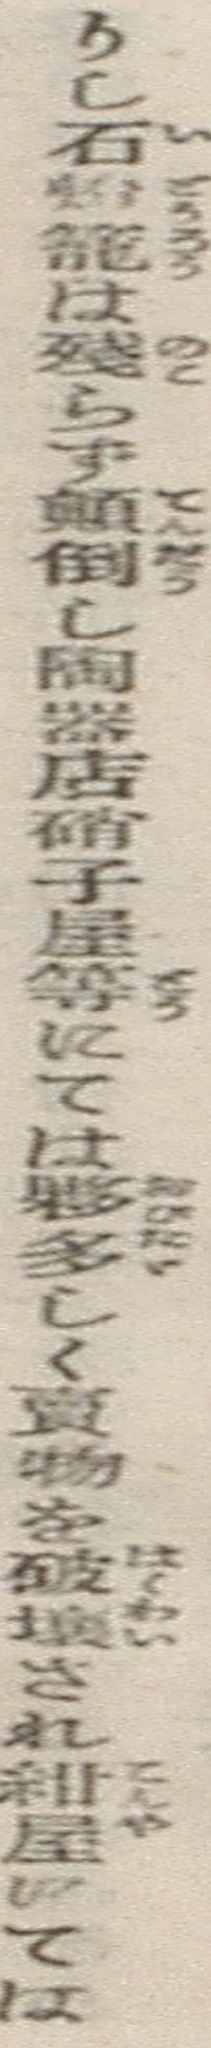りし石燈籠は残らず顛倒し陶器店硝子屋等にては夥多しく売物を破壊され紺屋にては
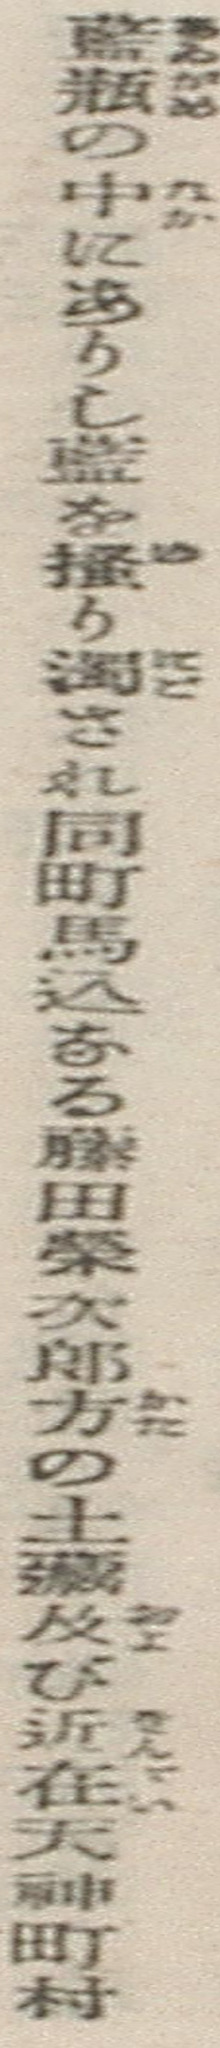藍瓶の中にありし藍を揺り濁され同町馬込なる藤田栄次郎方の土蔵及び近在天神町村
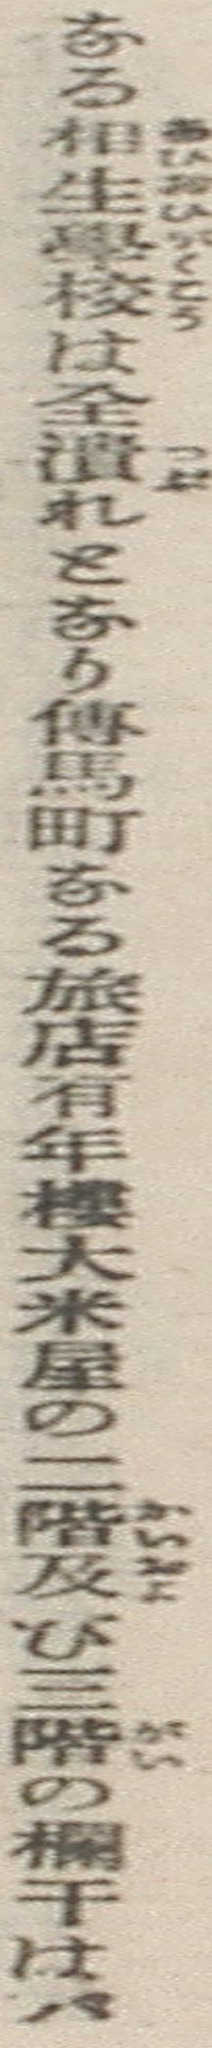なる相生學校は全潰れとなり伝馬町なる旅店有年楼大米屋の二階及び三階の欄干はバ
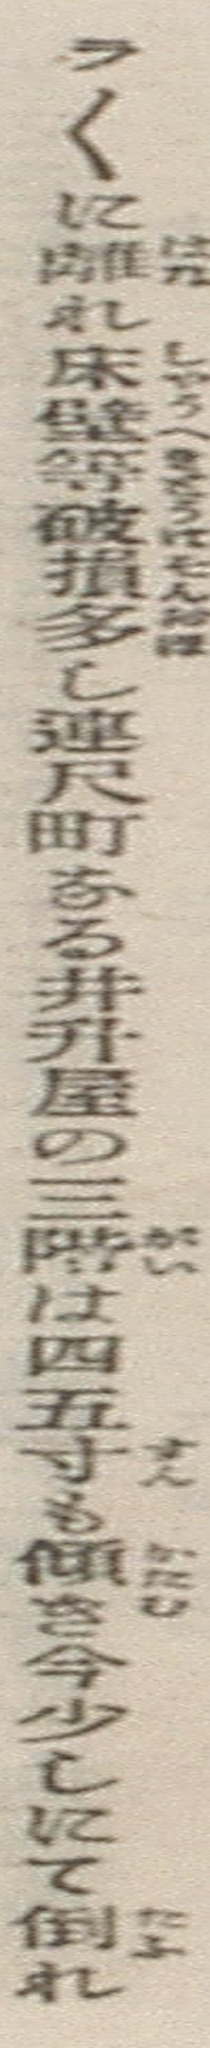ラ〳〵に離れ床壁等破損多し連尺町なる井升屋の三階は四五寸も傾き今少しにて倒れ
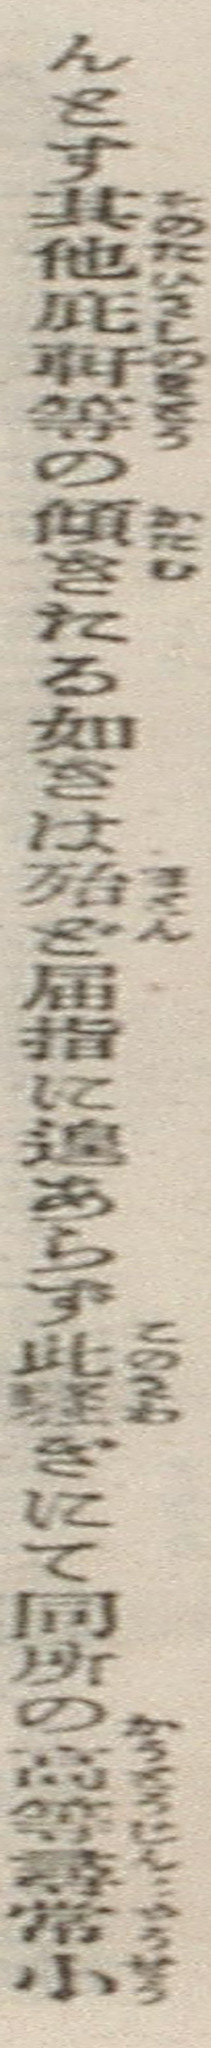んとす其他庇軒等の傾きたる如きは殆ど屈指に邊あらず此騒ぎにて同所の高等尋常小
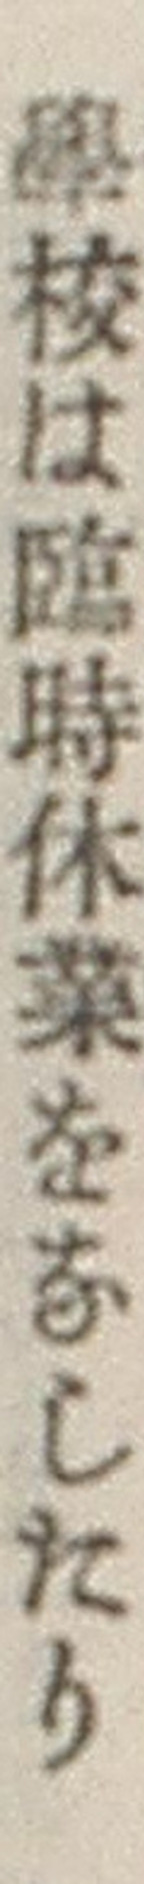学校は臨時休業をなしたり
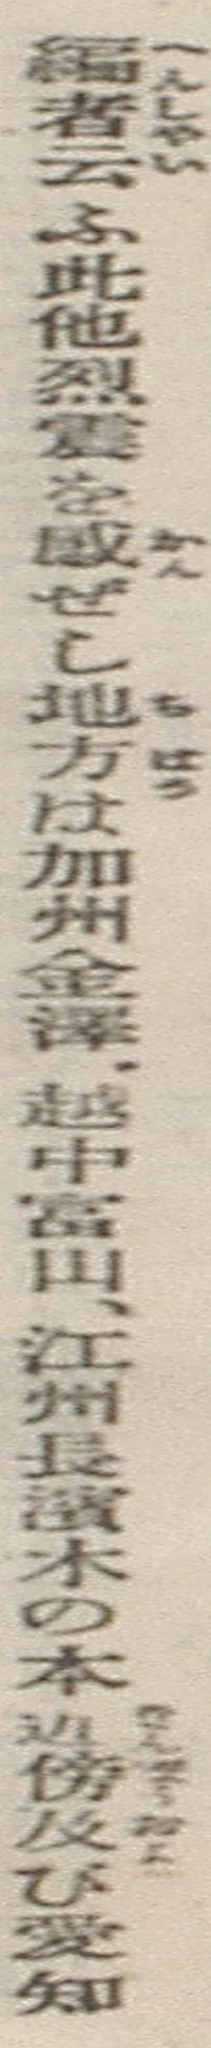編者云ふ此他烈震を感ぜし地方は加州金沢、越中富山、江州長濱木の本近傍及び愛知
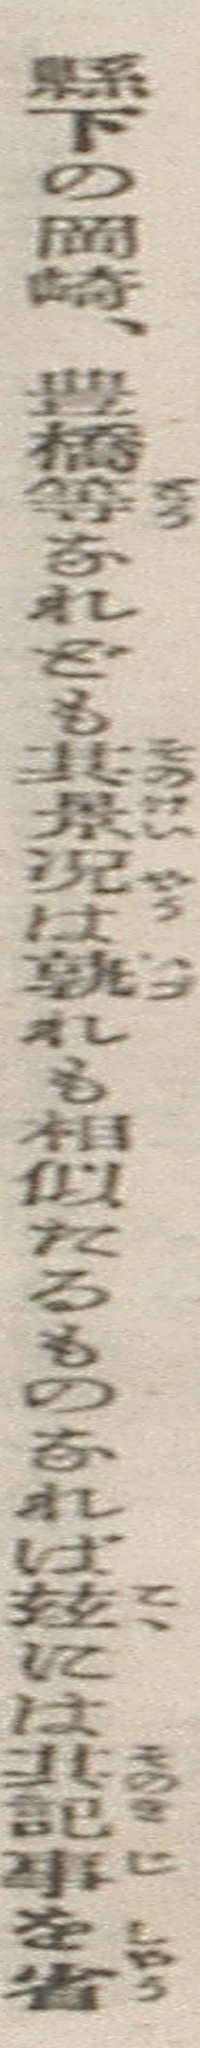縣下の岡崎、豊橋等なれども其景況は就れも相似たるものなれば茲には其記事を省
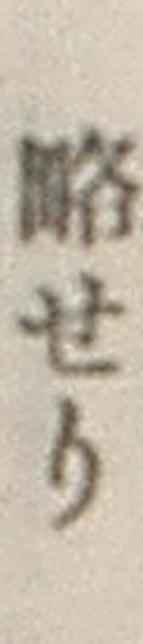略せり
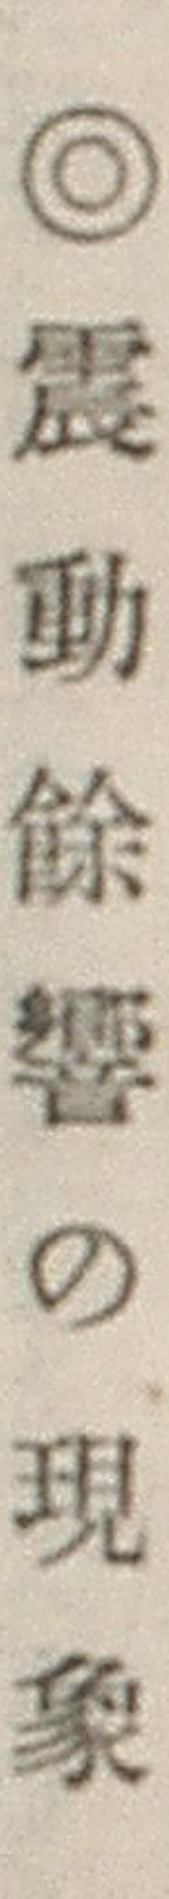◎震動餘響の現象
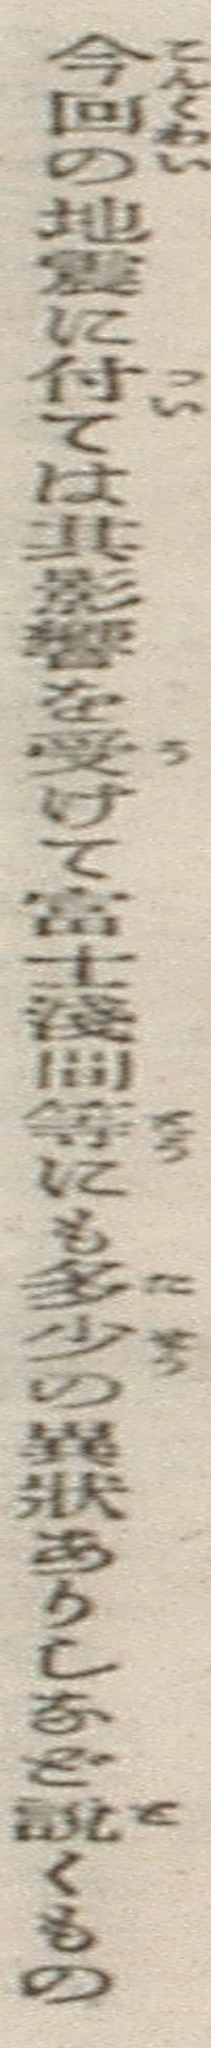今回の地震に付ては其影響を受けて冨士浅間等にも多少の異状ありしなど説くもの
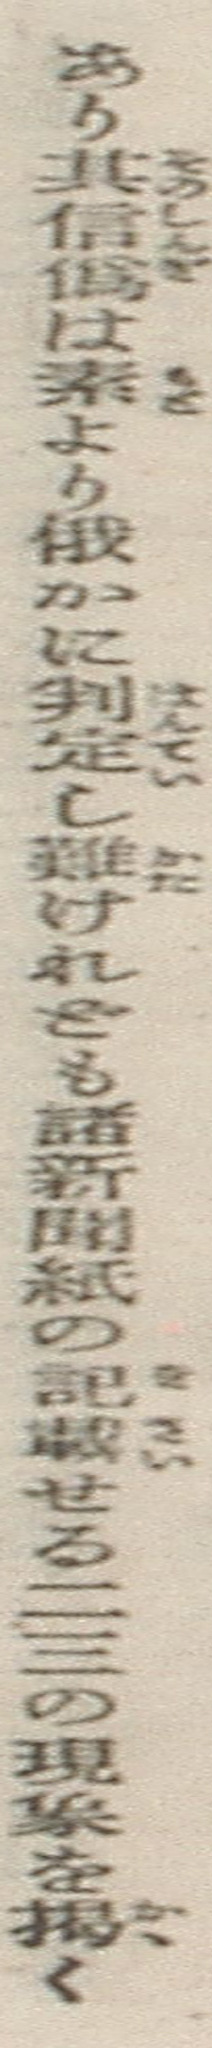あり其信偽は素より俄かに判定し難けれども諸新聞紙の記載せる二三の現象を掲く
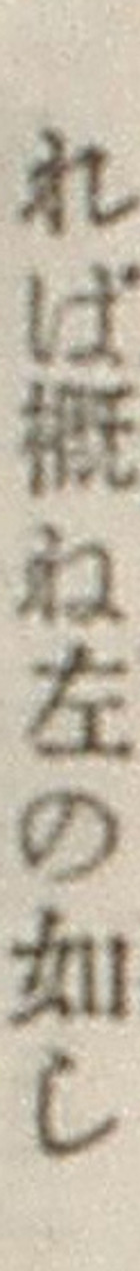れば概ね左の如し
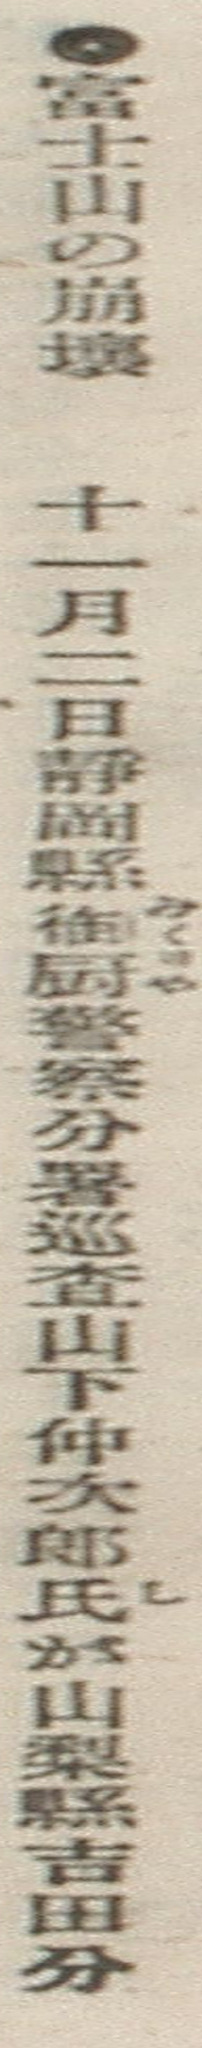●冨士山の崩壊十一月二日静岡縣御厨警察分署巡査山下仲次郎氏が山梨縣吉田分
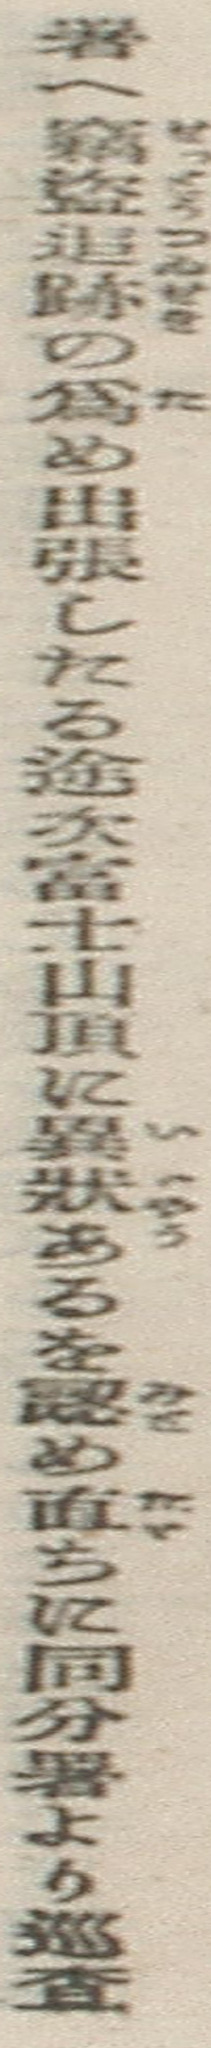署へ窃盗追跡の為め出張したる途次冨士山頂に異状あるを認め直ちに同分署より巡査
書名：愛知岐阜福井三県　大地震見聞録（内題）
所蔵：東京大学地震研究所図書室 Earthquake Research Institute Library, The University of Tokyo, JAPAN
